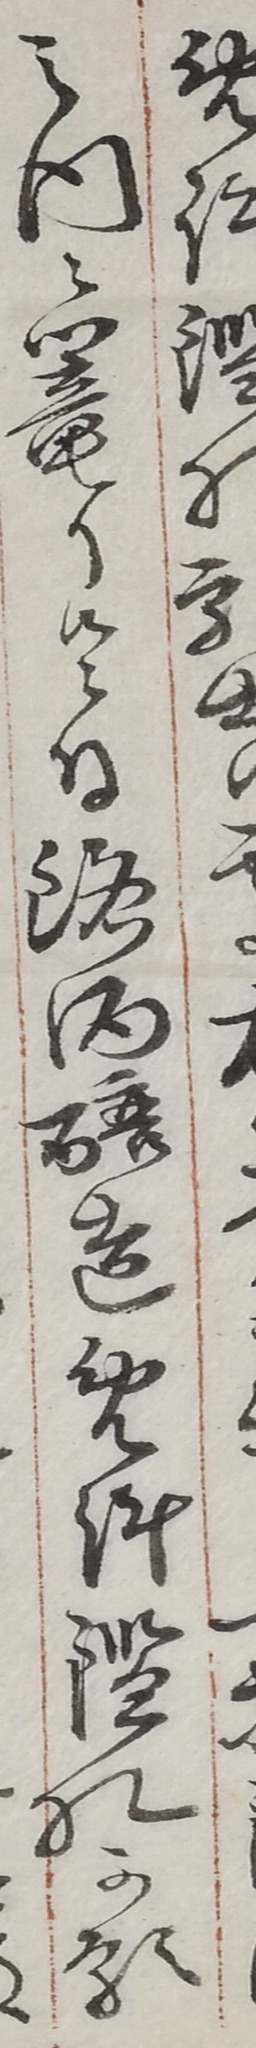之ニ篭り遺り候ニ付銘酒譲造免許鑑札可願
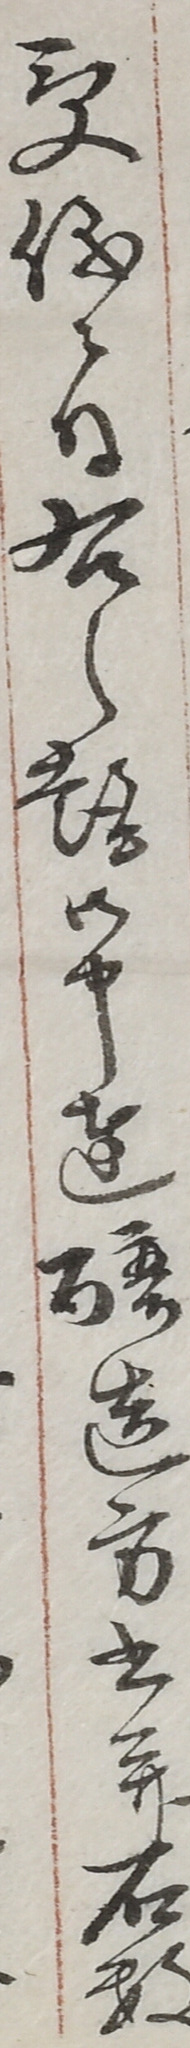受儀ニ付右之趣御申達醸造方書并右数
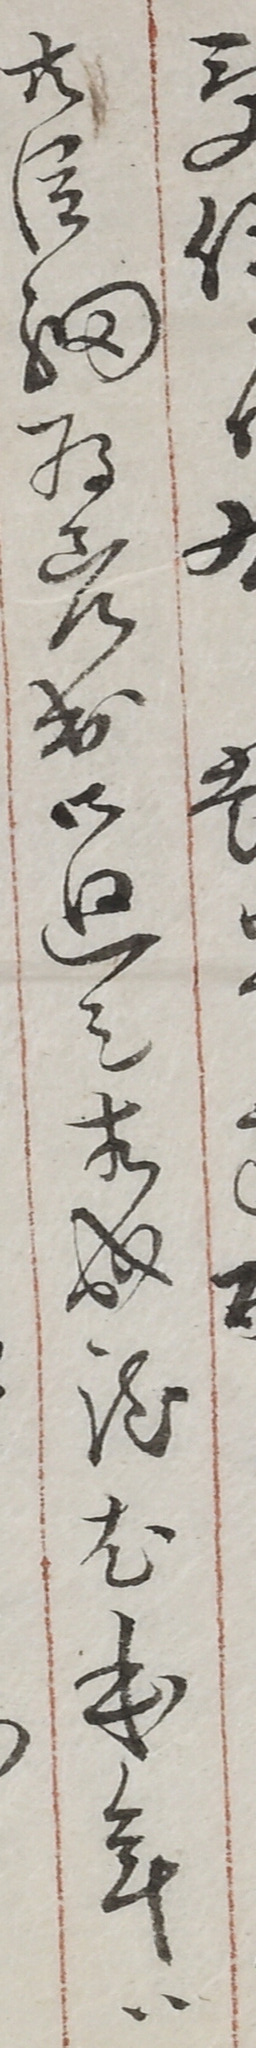共巨細為差出御廻シ相成儀尤本年ハ
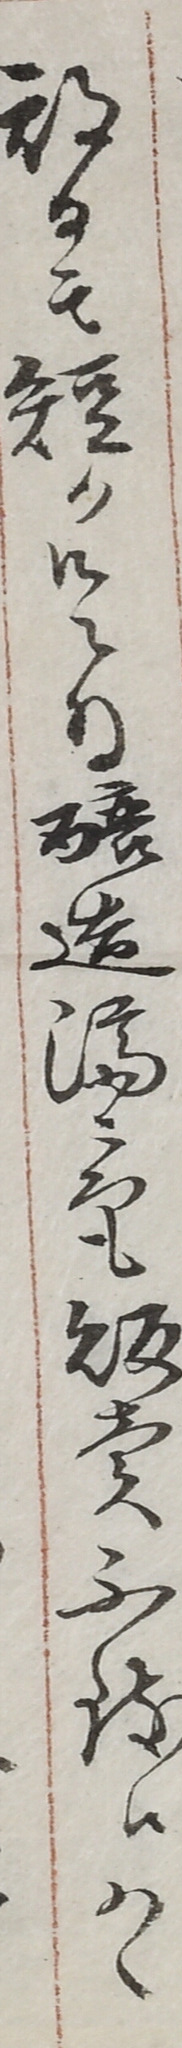期日モ短ク候ニ付醸造場ニ而も販売不致候はゝ
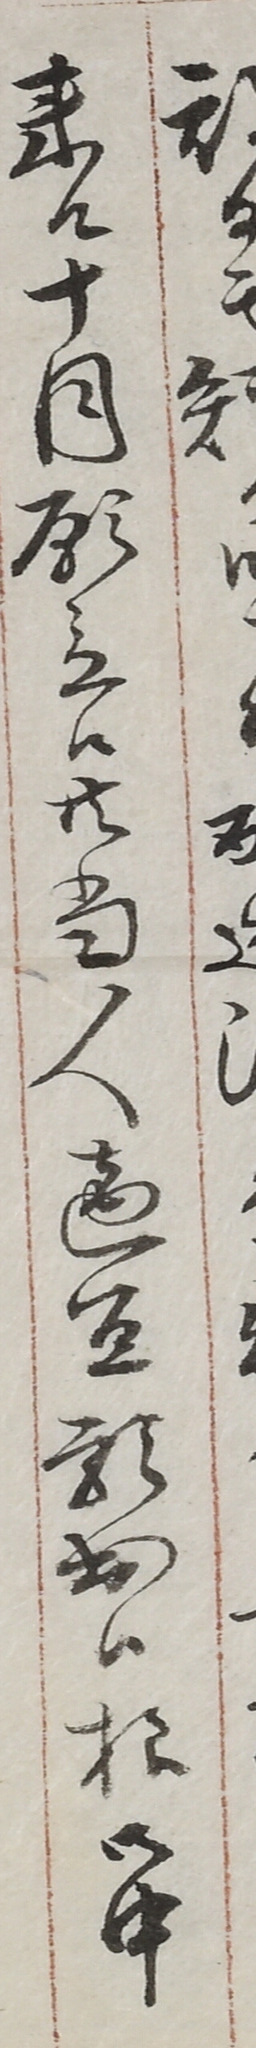来ル十月願立候共当人適宜願出候様御申
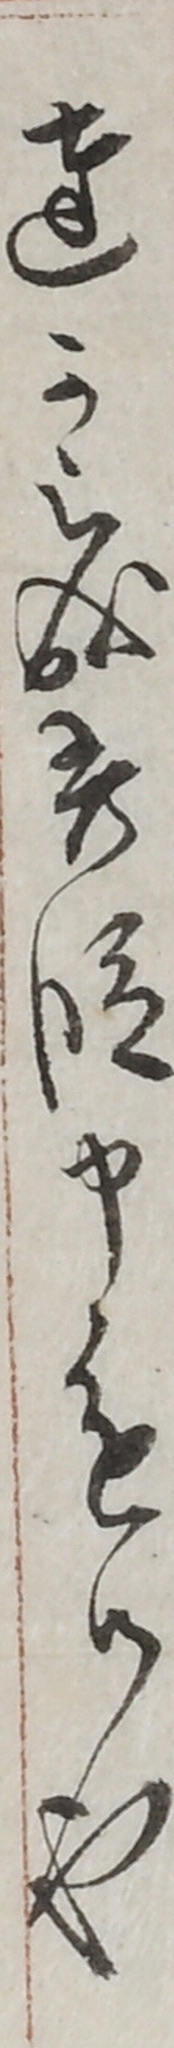達可被成候段申遣候也
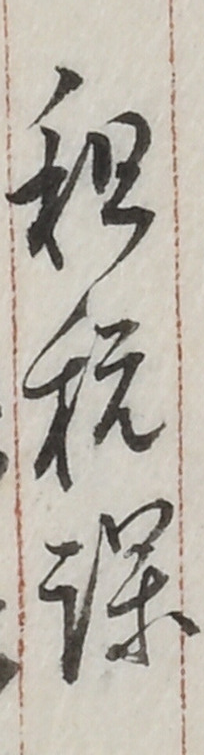租税課
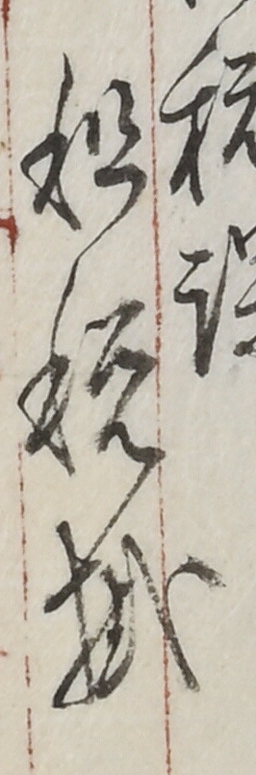租税課

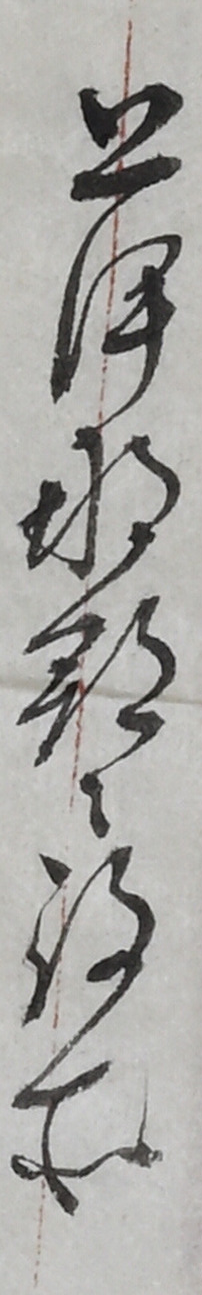上伊那郡々役所
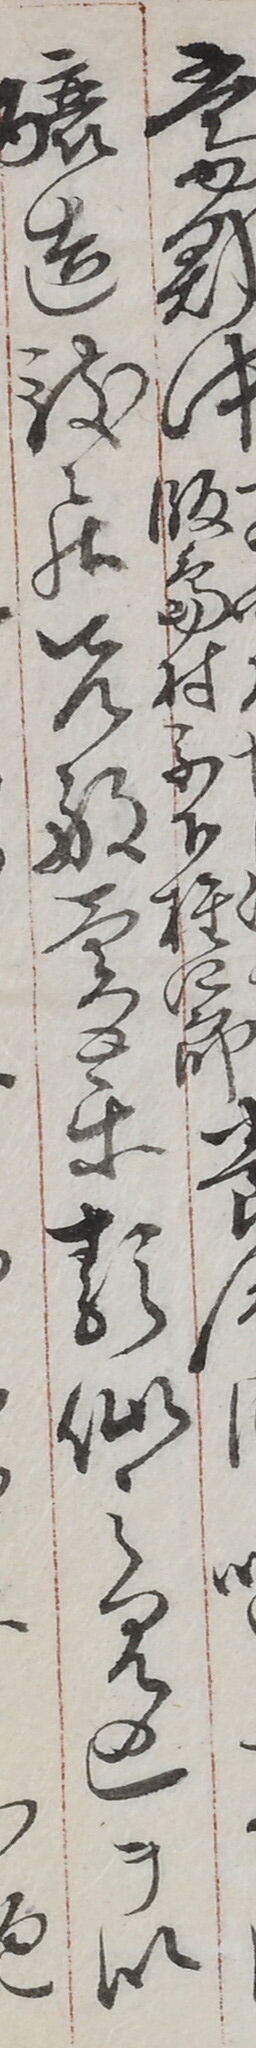譲遣致之状先般売薬類似之見込ヲ以
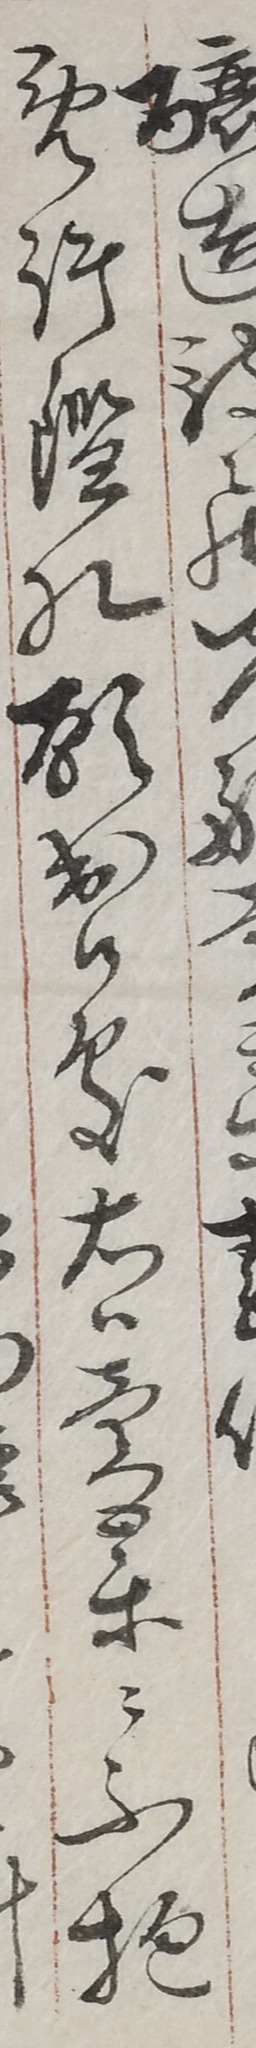免許鑑札願出候処右ハ売薬に不抱
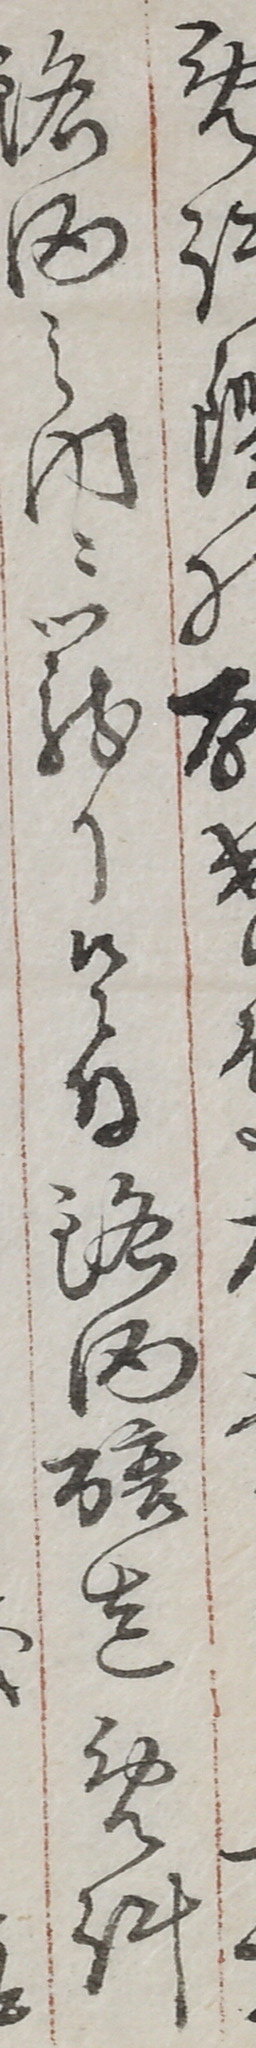銘酒之内ニ籠り候に付銘酒酸造免料
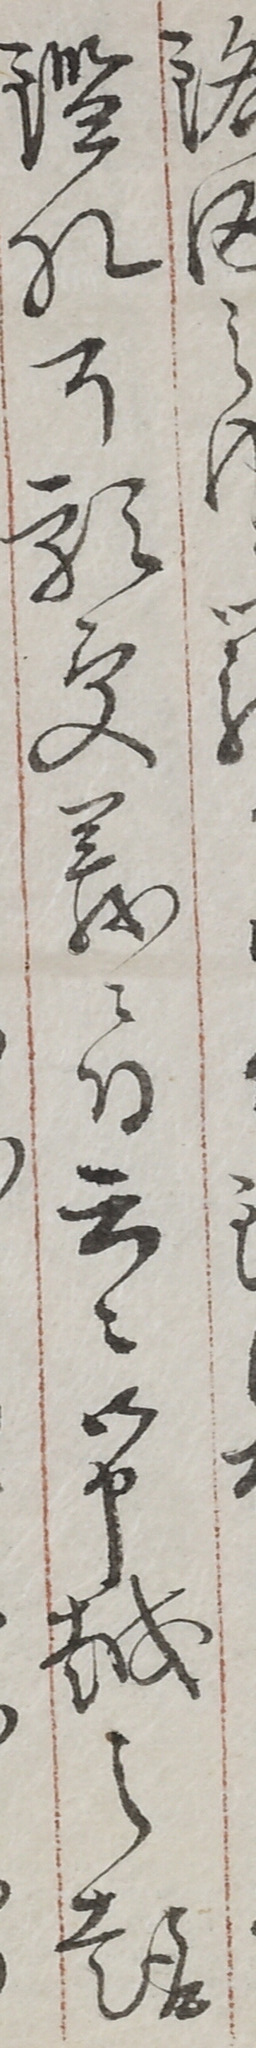鑑孔了願受義ニ付云々御申越之趣
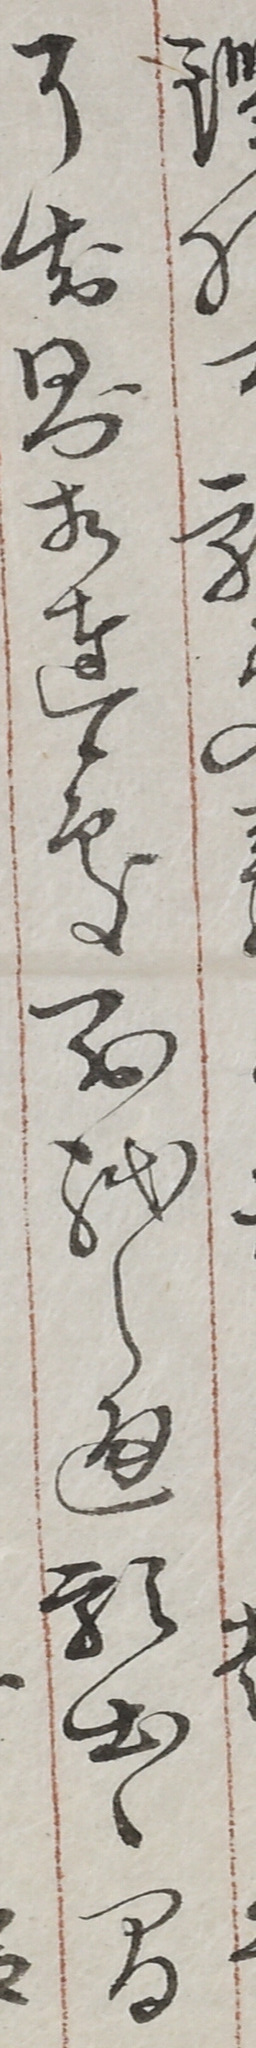了歩則相達候処別紙之通願出候間
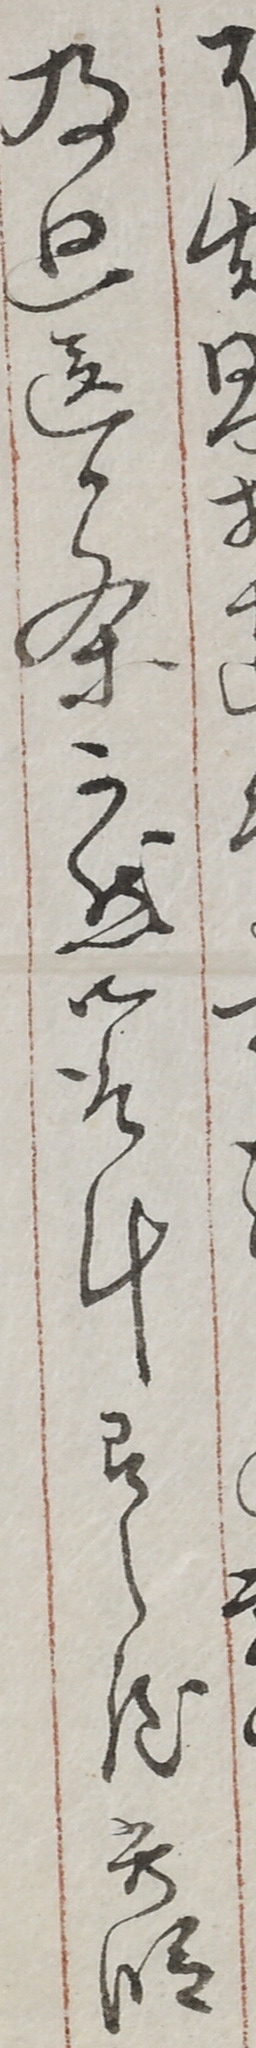為廻送候条可然御取計有之哉前段
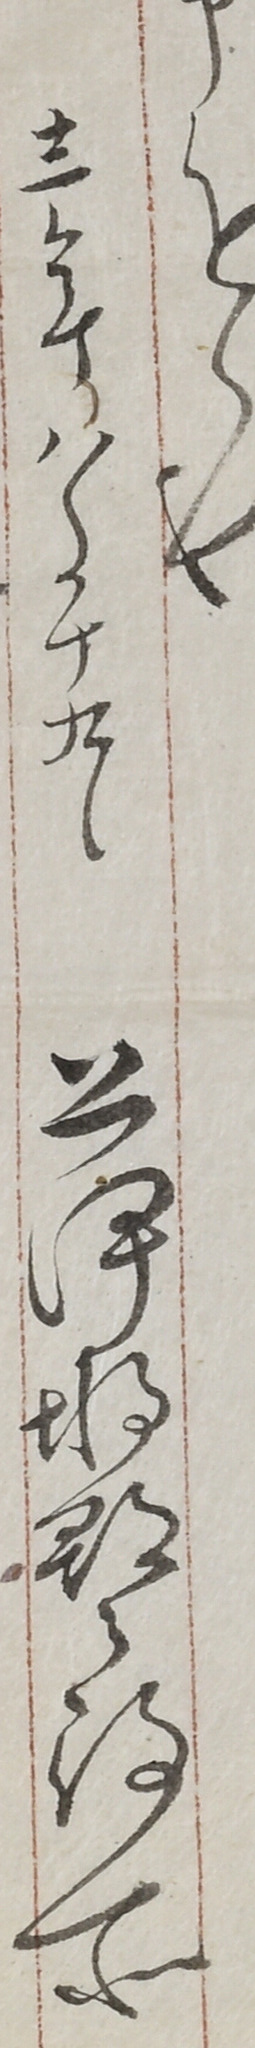十二年八月十九日上伊那郡々役所
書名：郡役所勤務中御用抜書
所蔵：伊那市立高遠町図書館・合同会社AMANE
